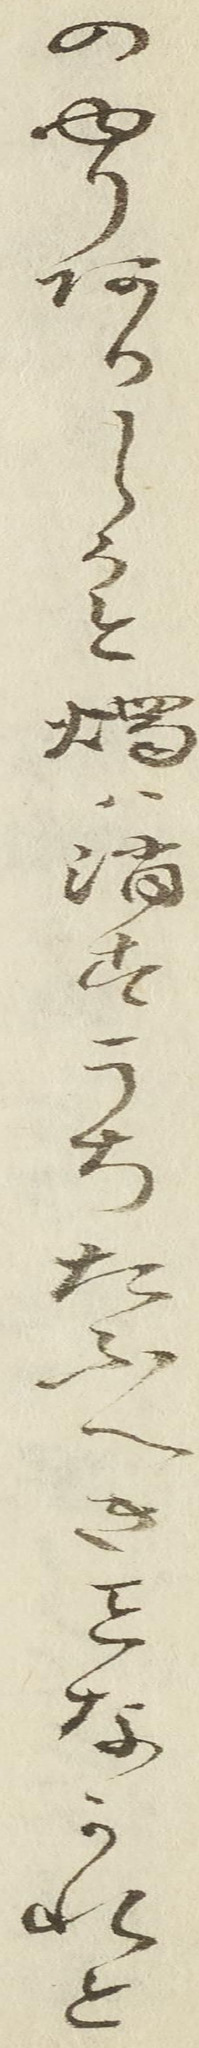のゆりありしかと燭ハ消すうちたふへきことなかれと
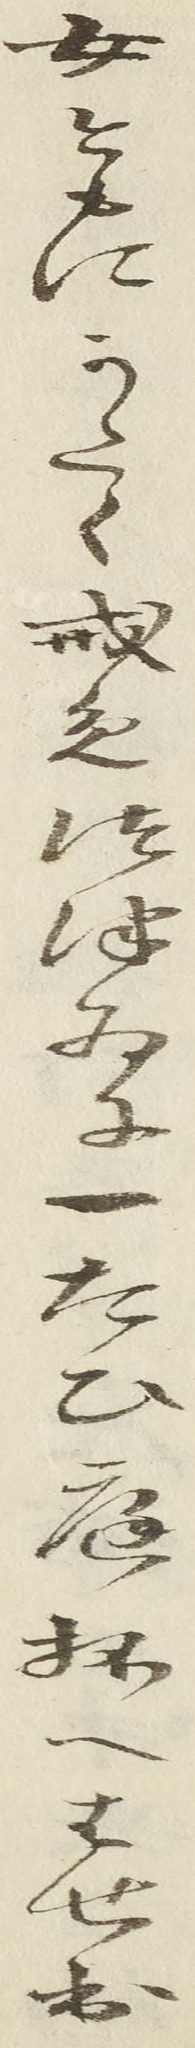女ともにかたく戒めつつゐに一たひ庭抔へはせ出
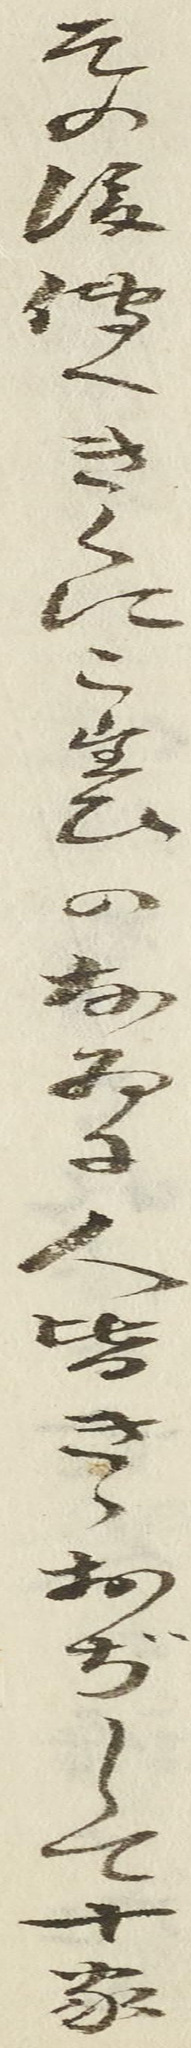その後伝へきくにこたひのなゐに人皆きゝおぢして十家
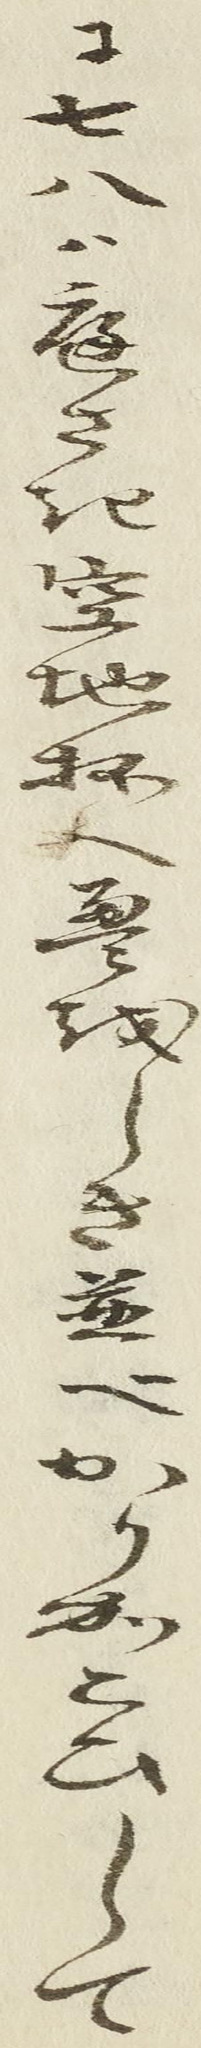に七八ハ庭さき空地抔へ畳をしき並べかりかこひして
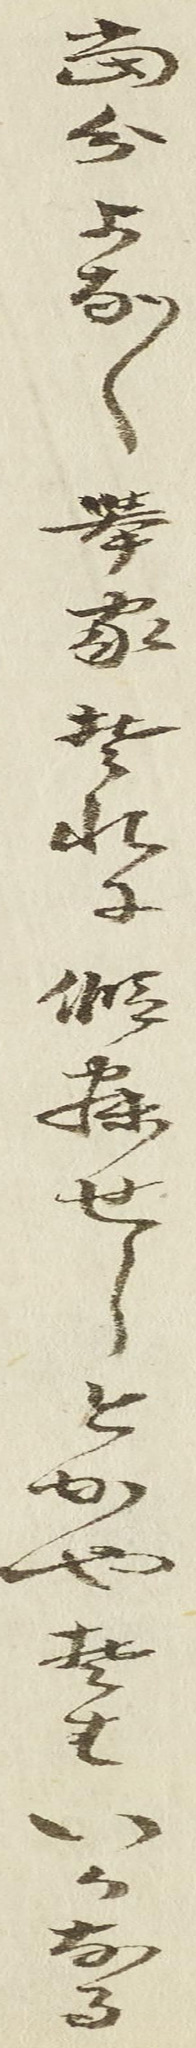当分よな〳〵擧家それに仮寝せしとかやそはいかなる
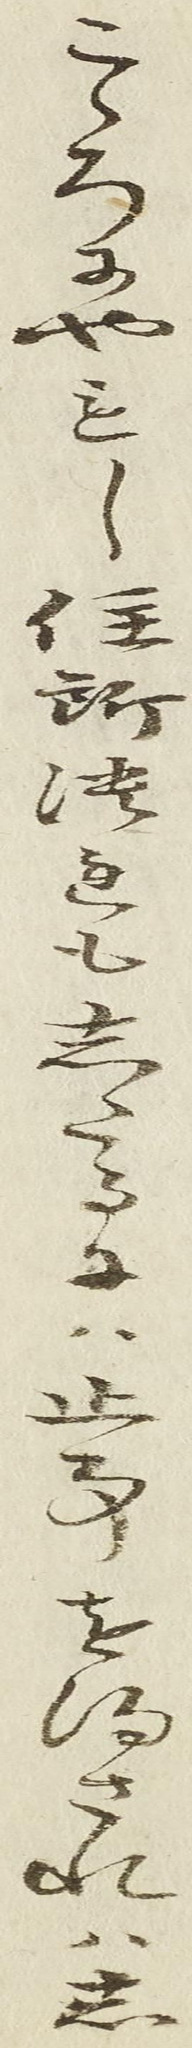こゝろにやもし住所潰れもしたるにハ止事を得たれハし
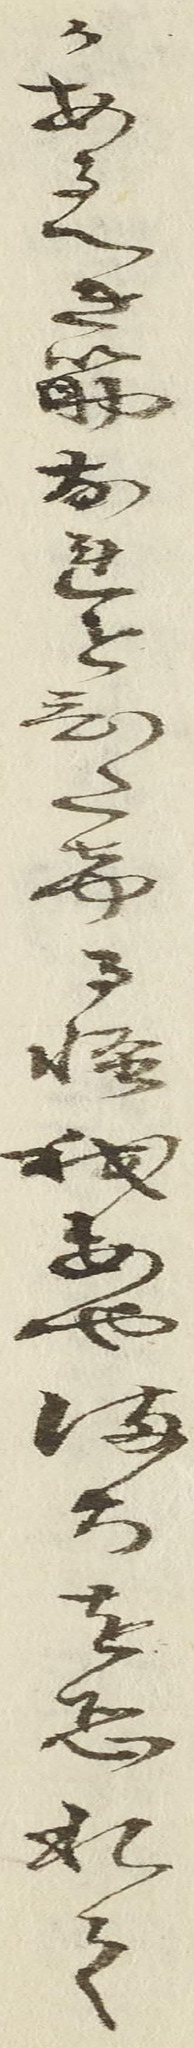かあるへき筋なれとひたける怪我あやまちを恐れて
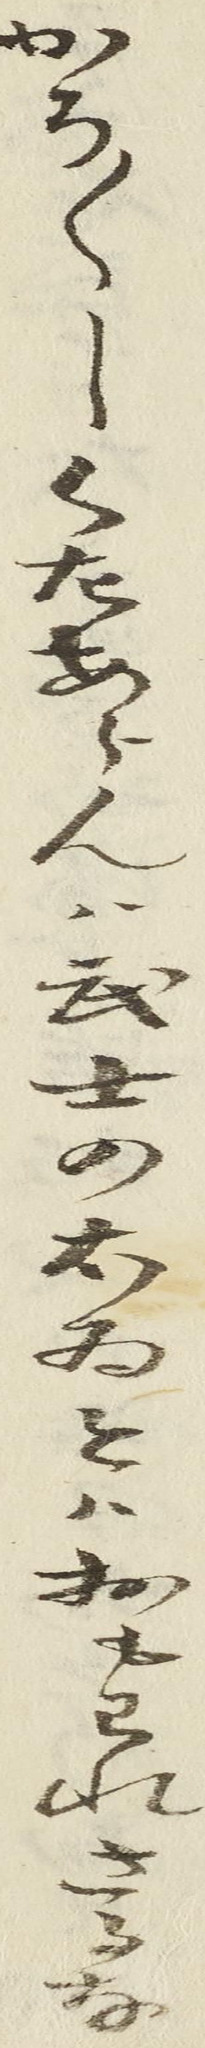かろ〳〵しく左あらんハ武士のたゐとハおもわれさるな
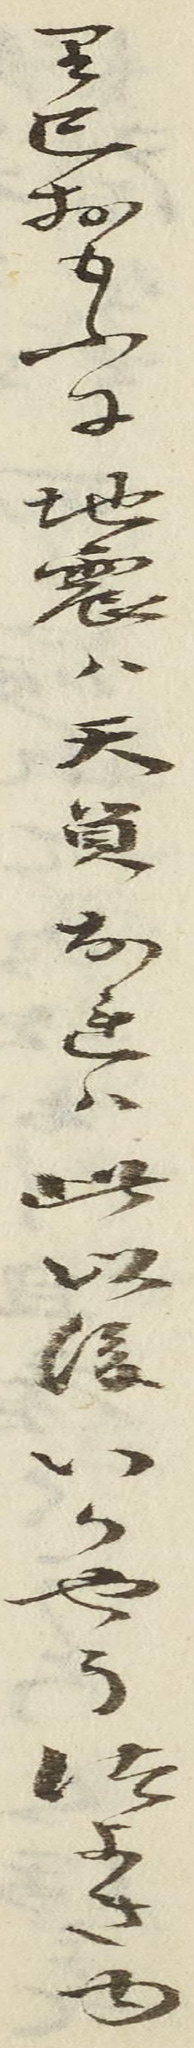り巳おもふに地震ハ天災なれハ此以後いかやうつよきゆ
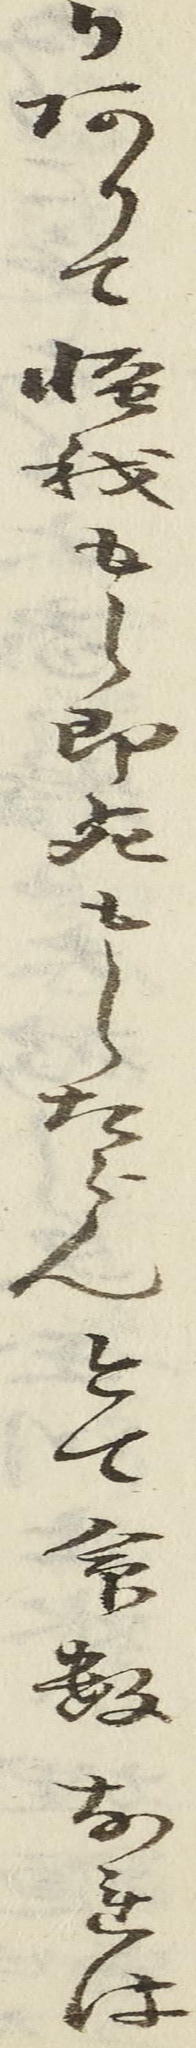りありて怪我もし即死もしたらんとて命数なれは
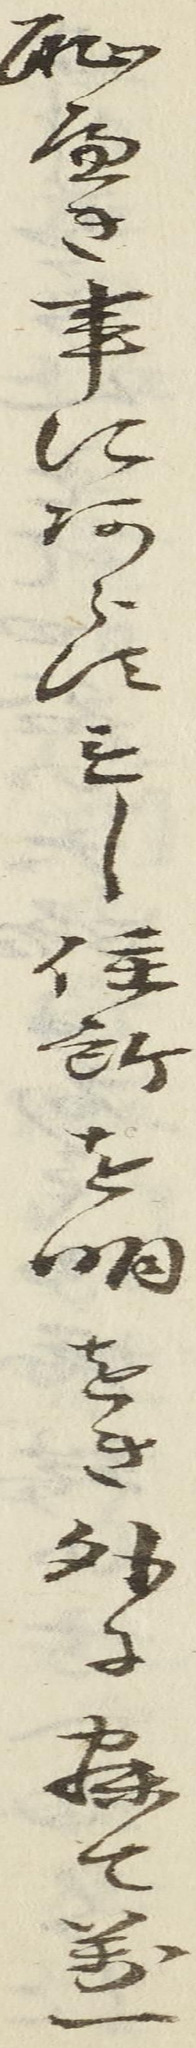恥へき事にならすもし住所を明をき外に寝て萬一
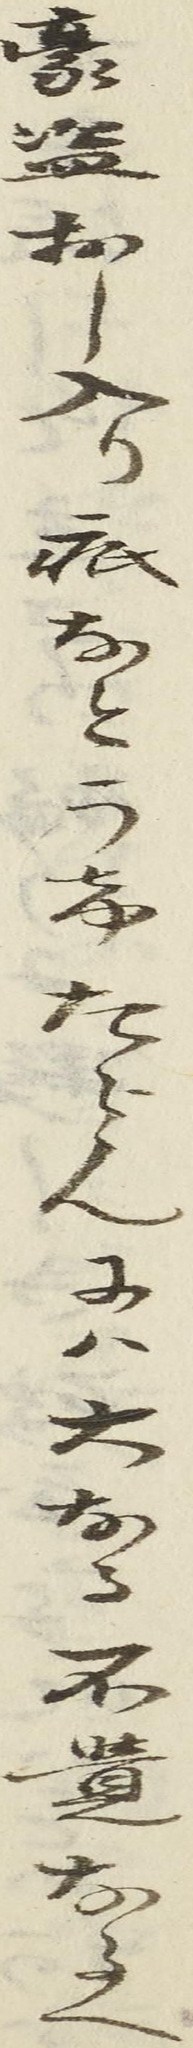豪盗おし入り疵なとうけたらんにハ大なる不覚なるへ
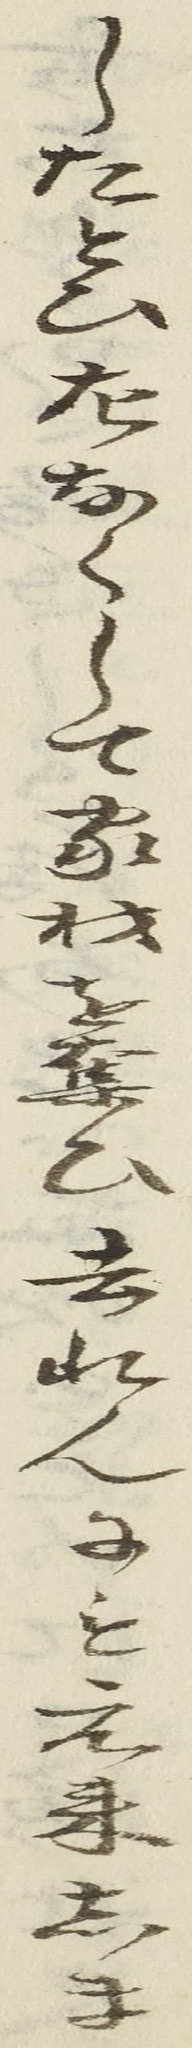したとひ左なくして家材を奪ひ去れんにも元来しま
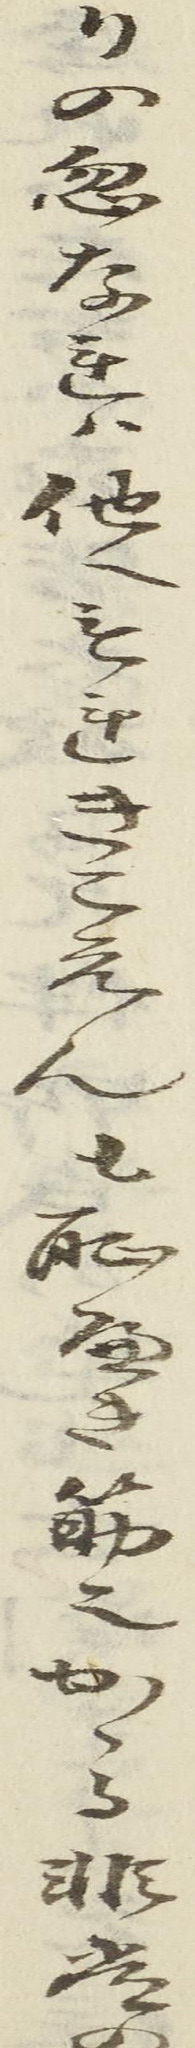りの忽なれハ他へもれきこえんも恥へき筋也かゝる非常の
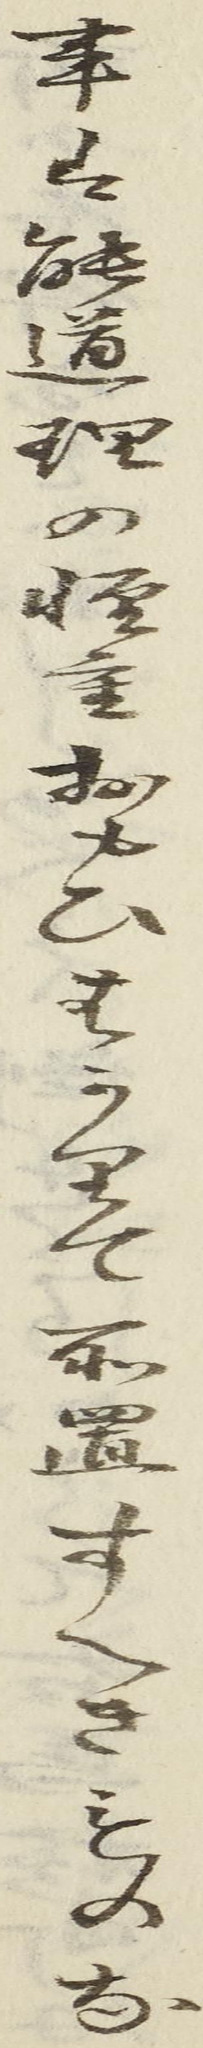事は能道理の軽重おもひはかりて所置すへきものな
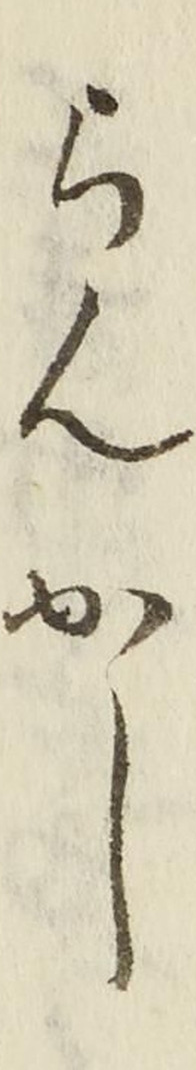らんかし
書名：那為の後見艸　全
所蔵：東京大学地震研究所図書室 Earthquake Research Institute Library, The University of Tokyo, JAPAN
